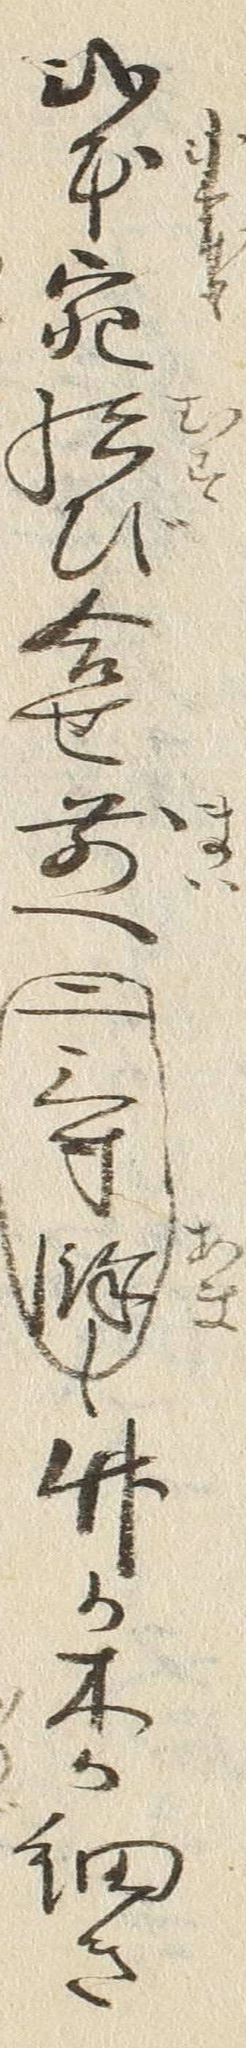弐本宛結び合せ前へ二三寸餘し竹か木か細き
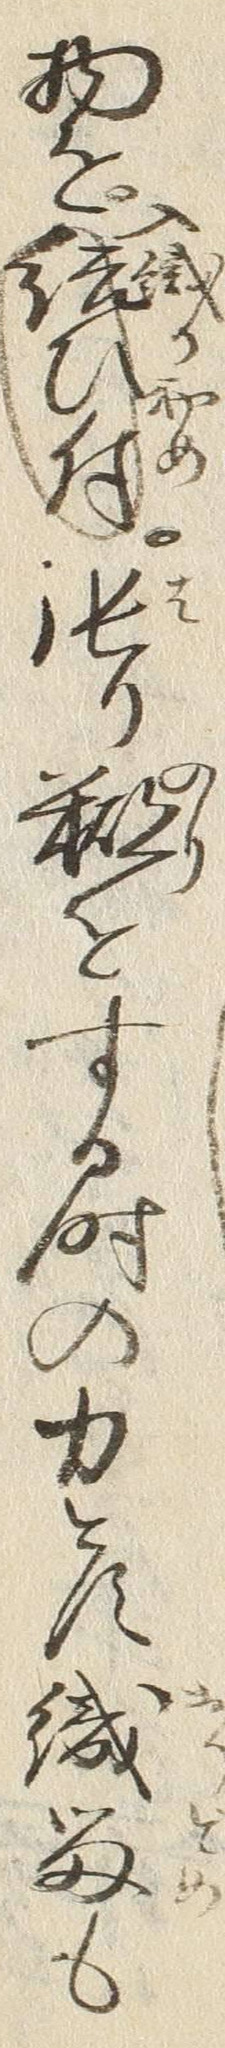物を入織り初め張り糊をする時の力と須織留も
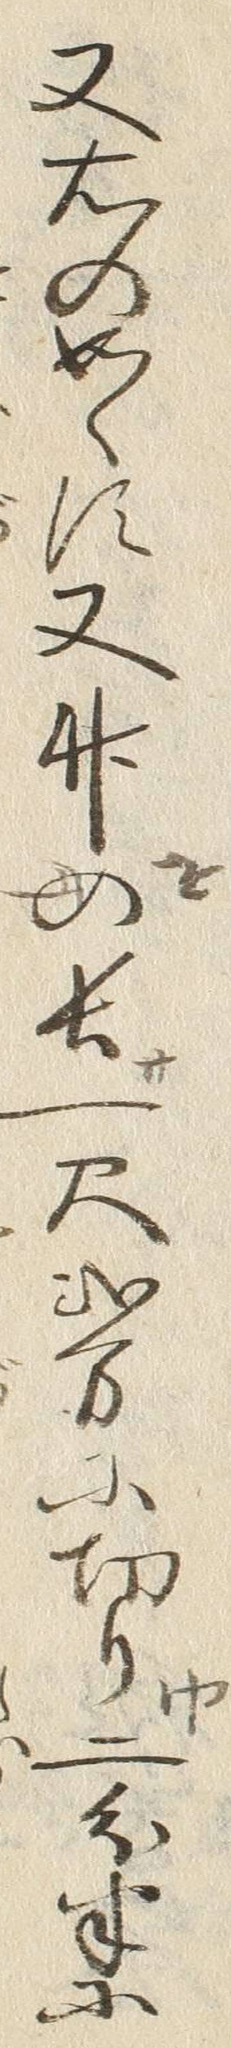又右の如く須又竹を長サ一尺弐分尓切り巾二分半尓
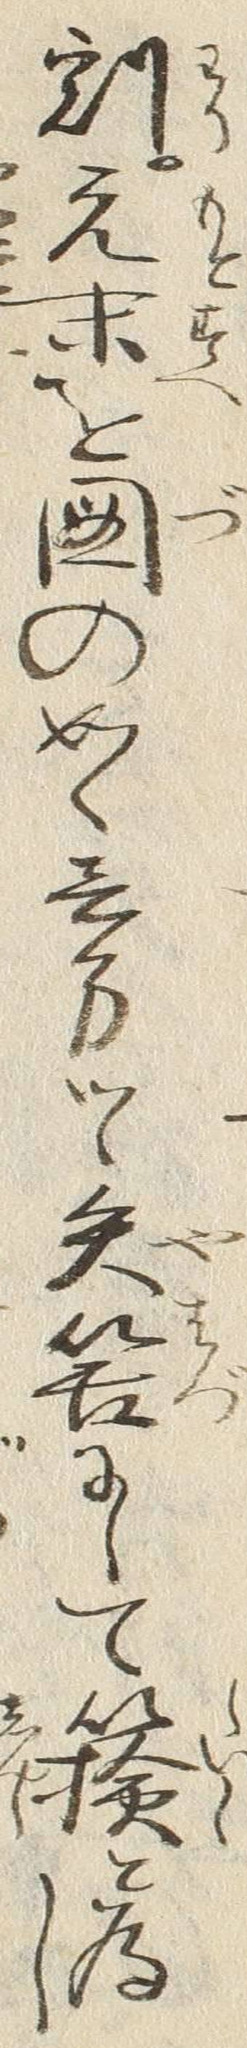割。元末を図の如く壱分ツゝ矢筈尓して籡と為し
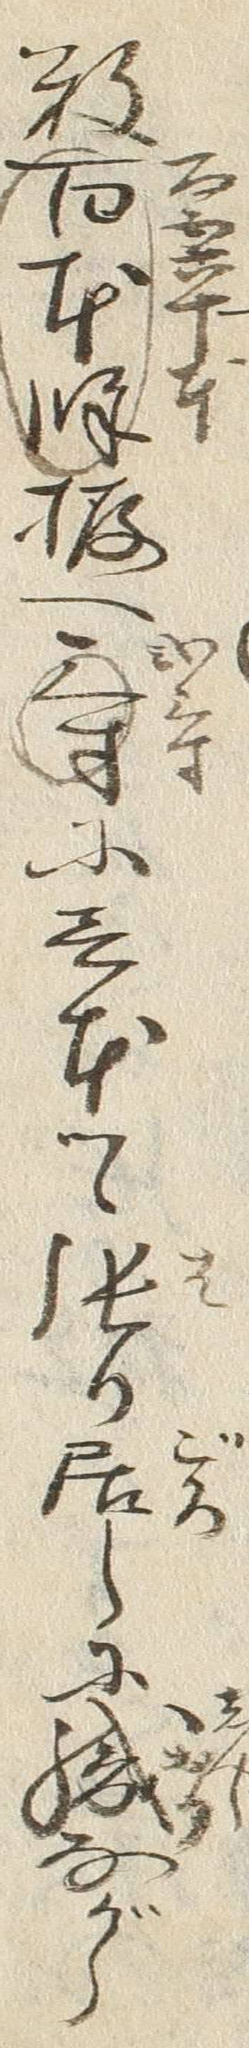数百五六十本拵へ弐三寸尓壱本ツゝ張り居し尓織ながら
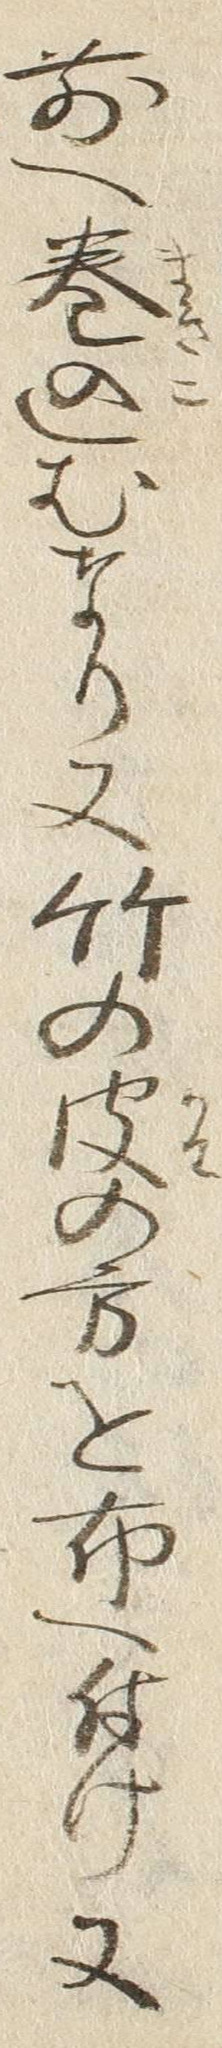前へ巻込むなり又竹の皮の方を布へ付け又
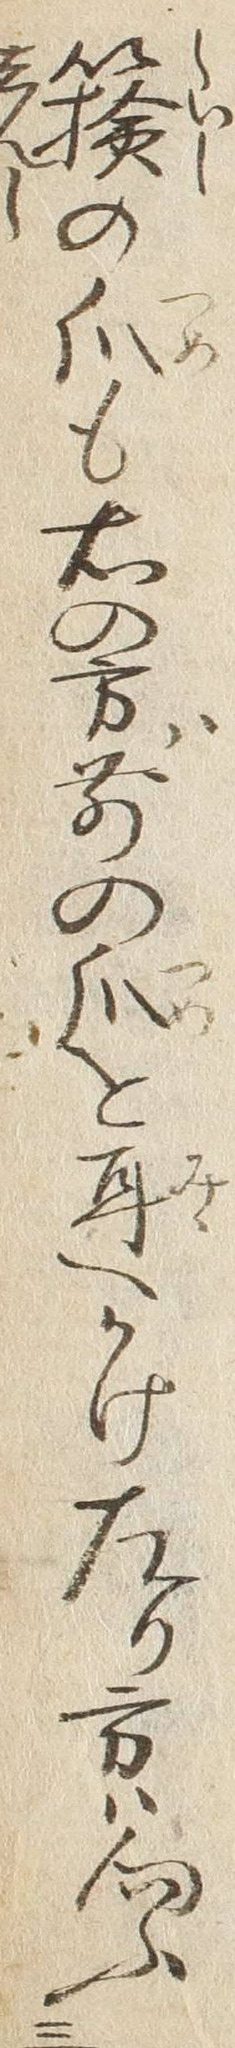籡の爪も右の方は前の爪を耳へかけたり方は向ふ

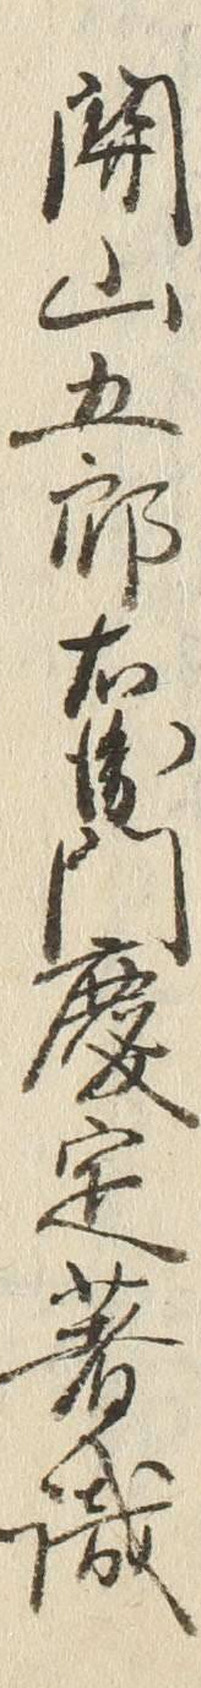開山五郎右衛門慶定著識
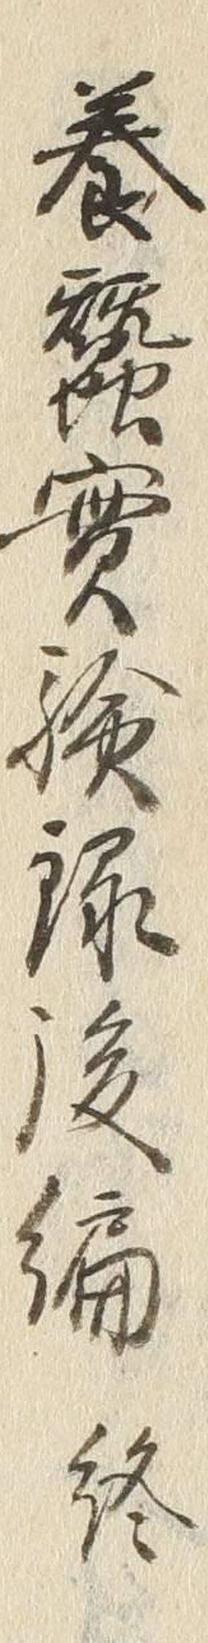養蠺實験録後編終
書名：養蠶實驗録後編
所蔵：東京大学農学生命科学図書館 国文学研究資料館
